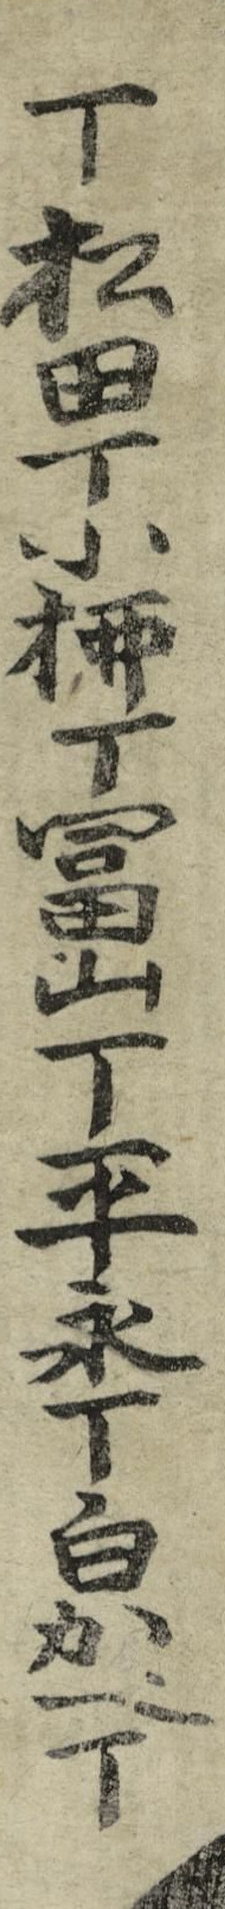丁松田丁小柳丁富山丁平永丁白かべ丁
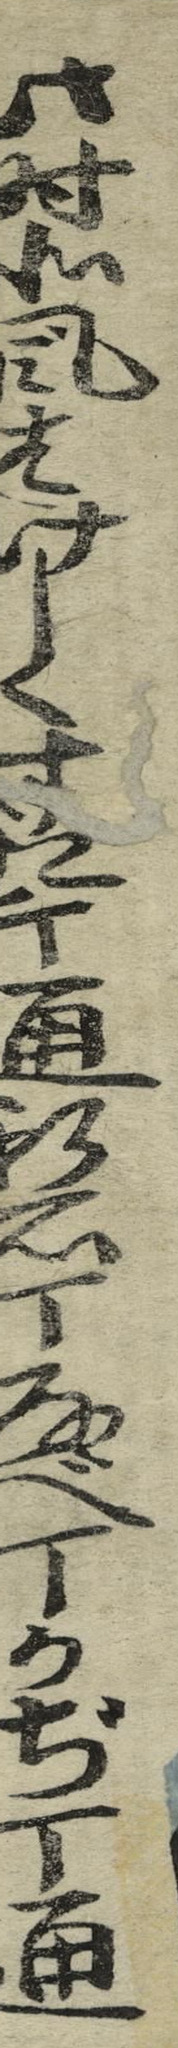此時北風はけしくすた丁通新石丁なべ丁かぢ丁通
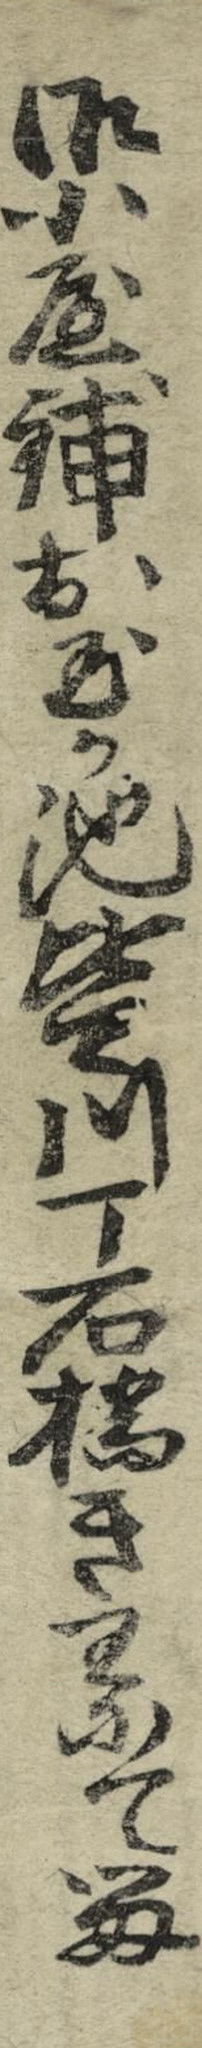御小屋舗お玉カ池皆川丁石橋きわにて留
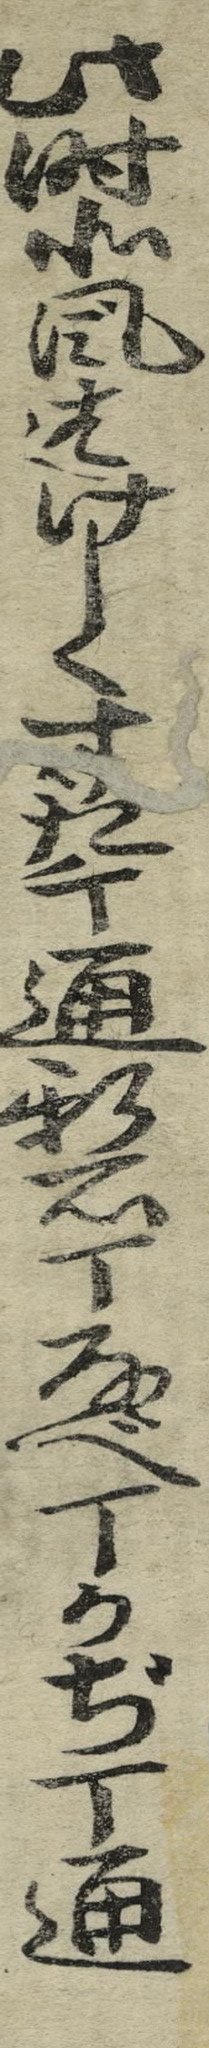此時北風はけしくすた丁通新石丁なべ丁かぢ丁通
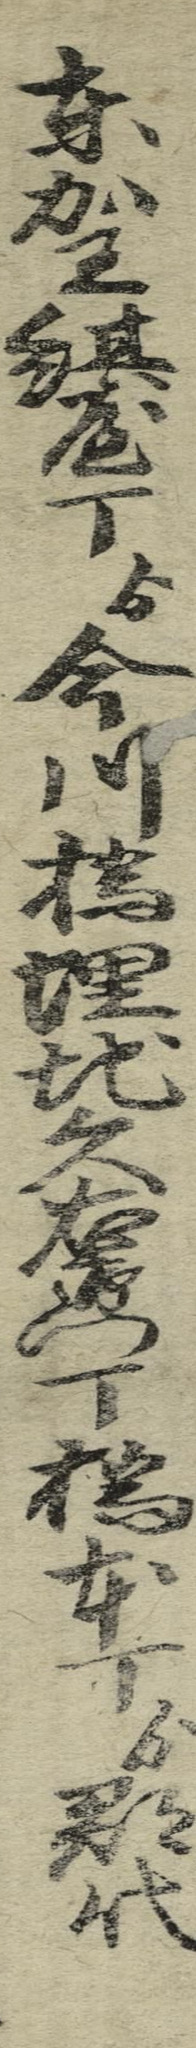東かわ紺屋丁ゟ今川橋埋地久右衛門丁橋本丁ゟ郡代
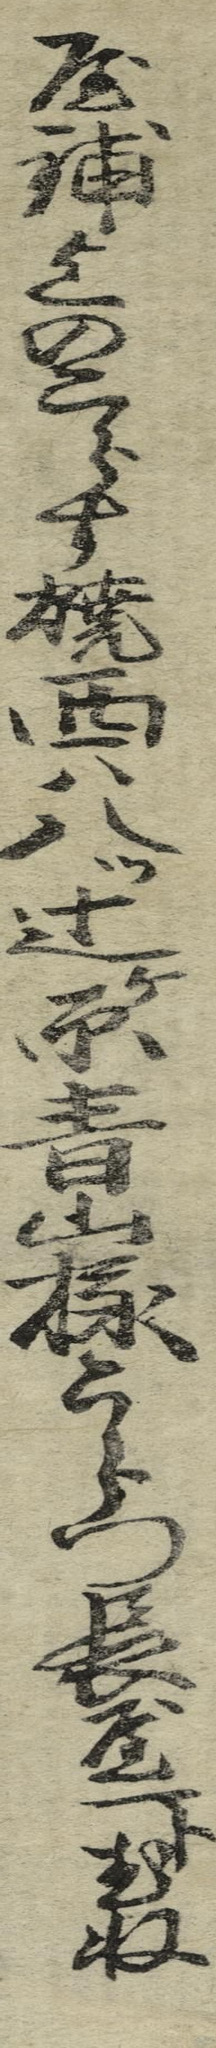屋鋪迄のこらす焼西は八ッ辻ヶ原青山様うら門長屋一ㇳむね
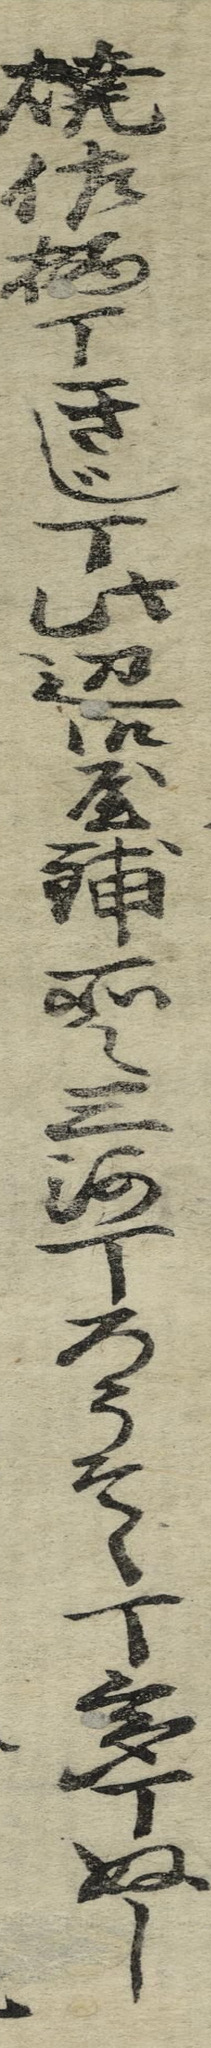焼佐柄丁きじ丁此辺御屋鋪所々三河丁ろうそく丁多丁ぬし
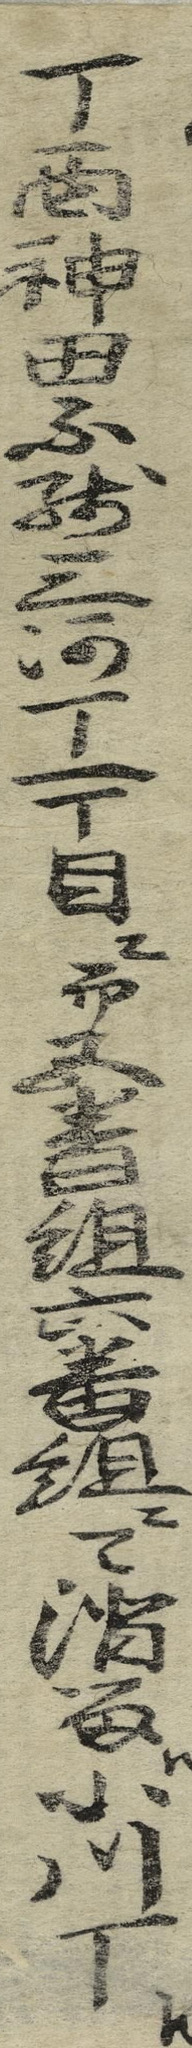両神田不残三河丁一丁目に而五番組六番組にて消留ル小川丁
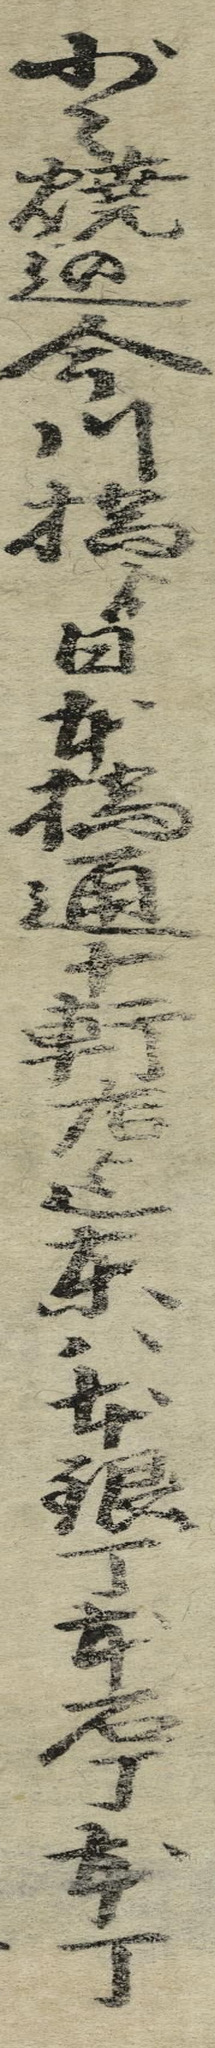少々焼込今川橋ゟ日本橋通十軒店迄東は本銀丁本石丁本丁
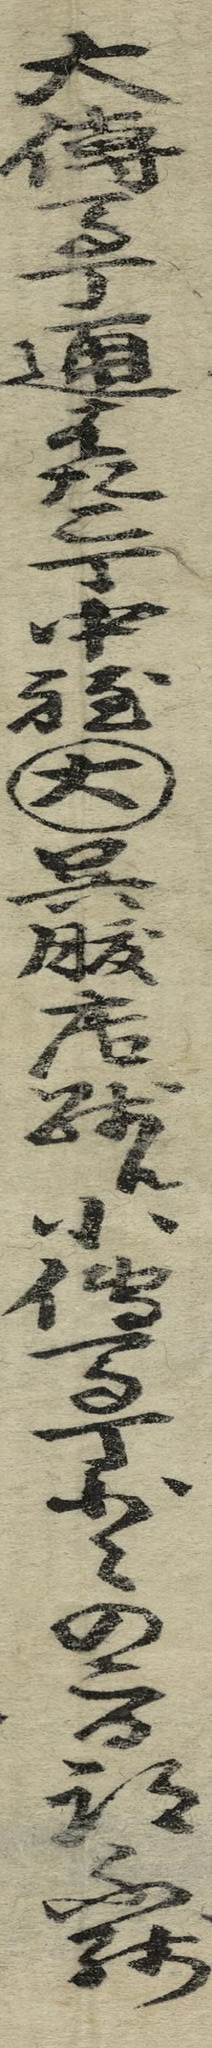大傳馬丁通はたこ丁中程大呉服店残ル小傳馬丁少々のこる跡不残
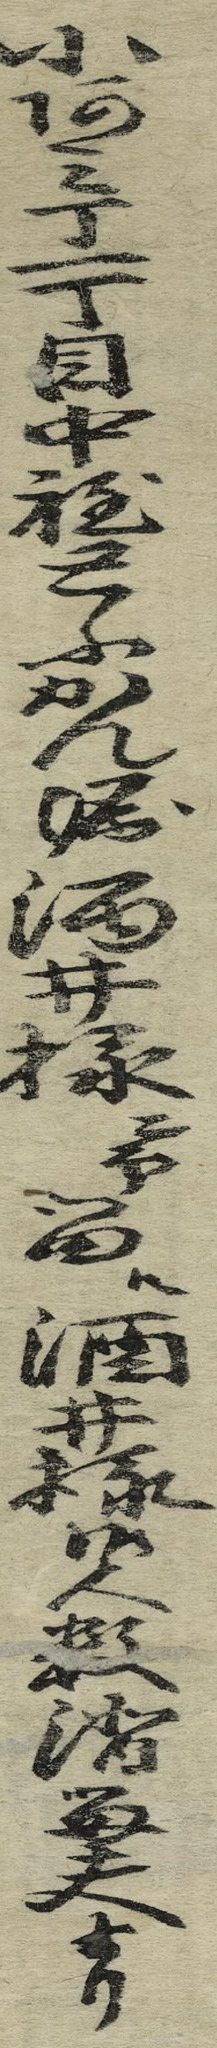小あみ丁一丁目中程とふかん堀酒井様に而留ル酒井様御人数消留夫より
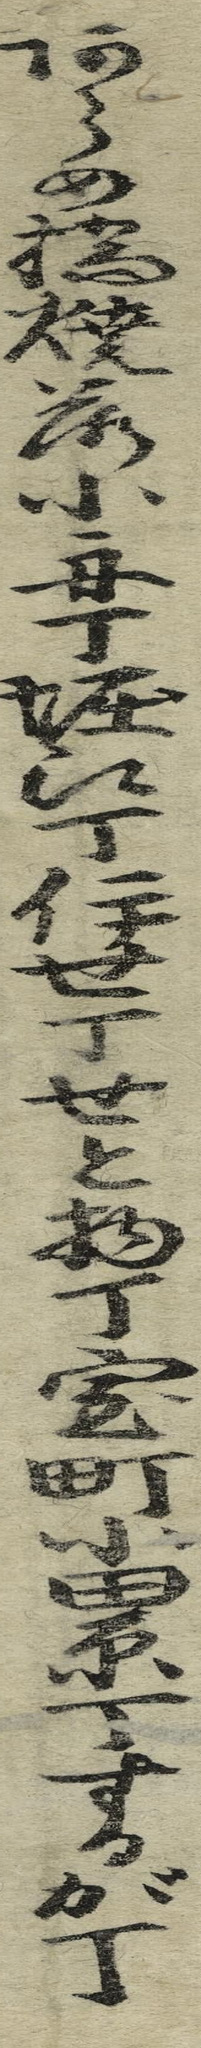あらめ橋焼落小舟丁堀江丁伊せ丁せと物丁宝町小田原丁するが丁
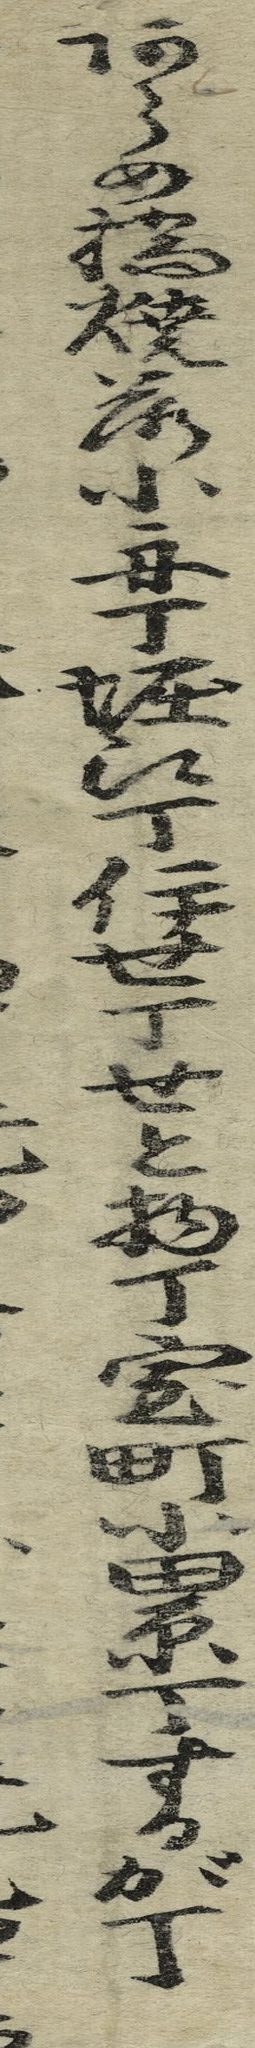あらめ橋焼落小舟丁堀江丁伊せ丁せと物丁宝町小田原丁するが丁
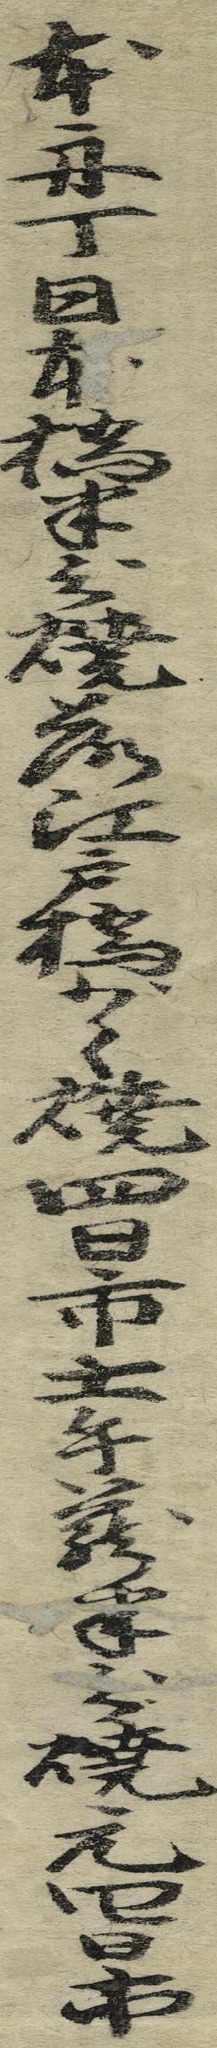本舟丁日本橋半分焼落江戸橋少々焼四日市土手蔵半分焼元四日市
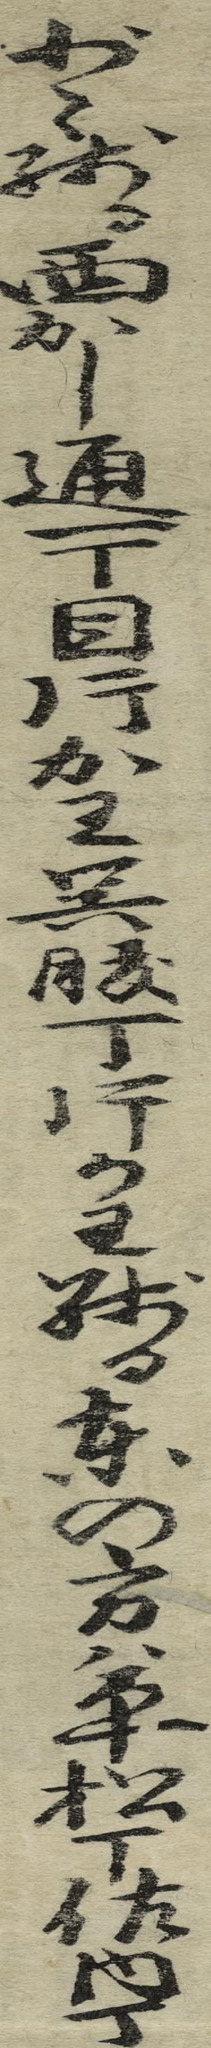少々残る西かし通一丁目片かわ呉服丁片かわ残る東の方ハ平松丁佐内丁
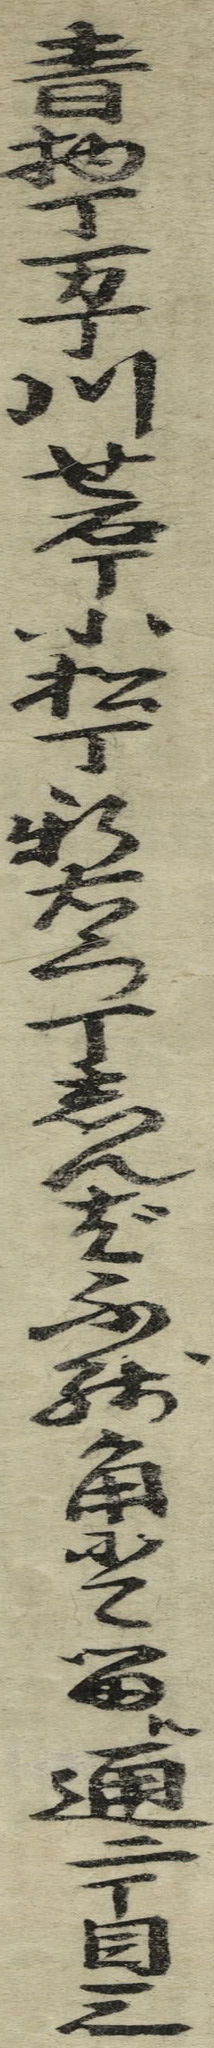青物丁万丁川せ石丁小松丁新右衛門丁しんば不残角にて留ル通二丁目三
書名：安政五午十一月十五日焼場方角附
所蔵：東京大学地震研究所図書室 Earthquake Research Institute Library, The University of Tokyo, JAPAN
